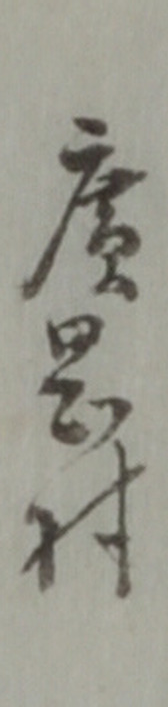広岡村
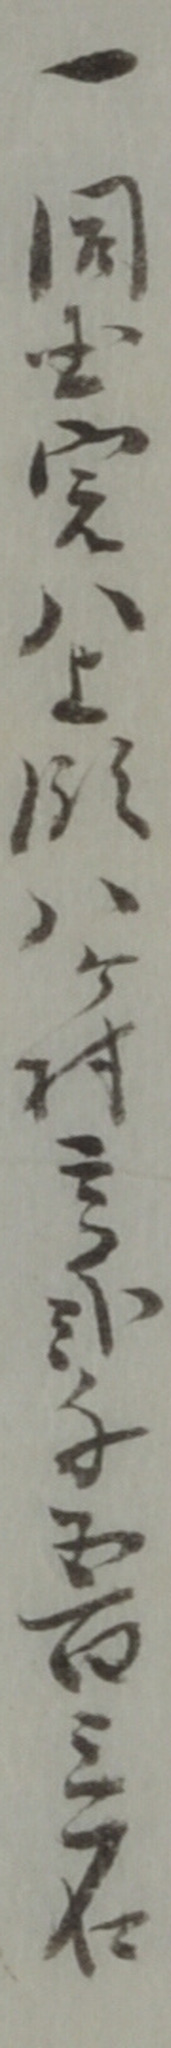一同国完八上領八ケ村高弐千五百三石
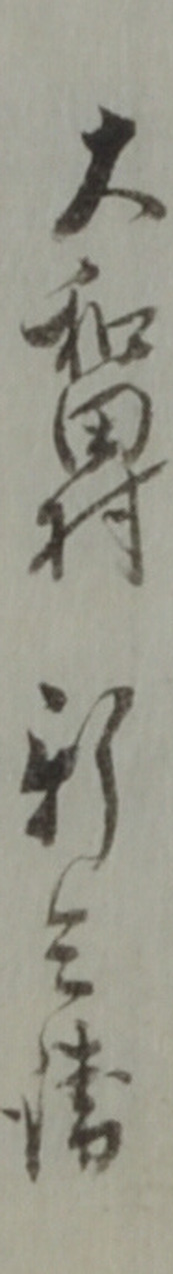大和田村新兵衛
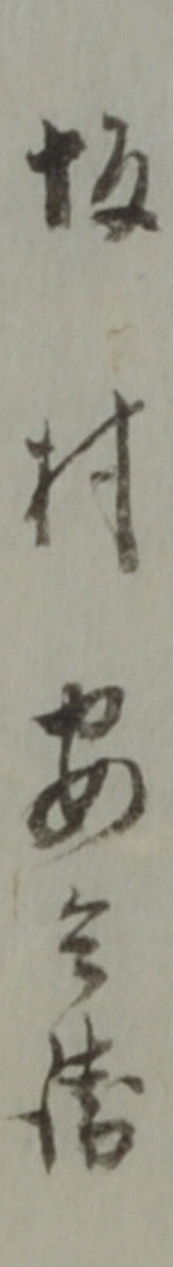坂村安兵衛
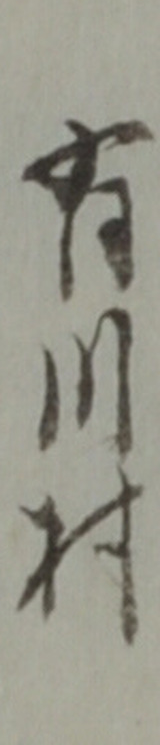有川村
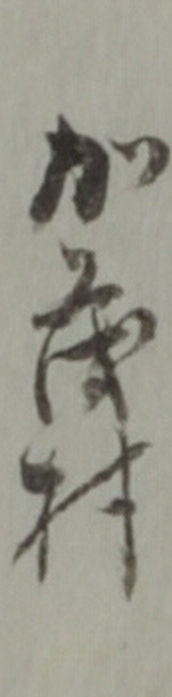加茂村
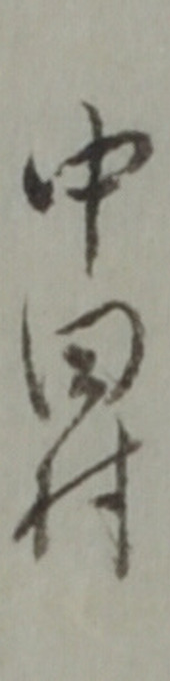中田村
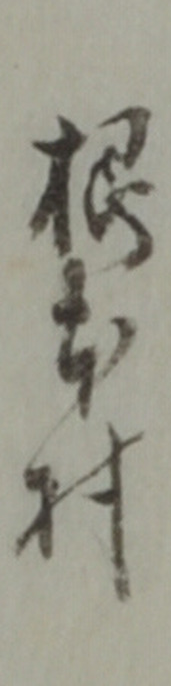根本村
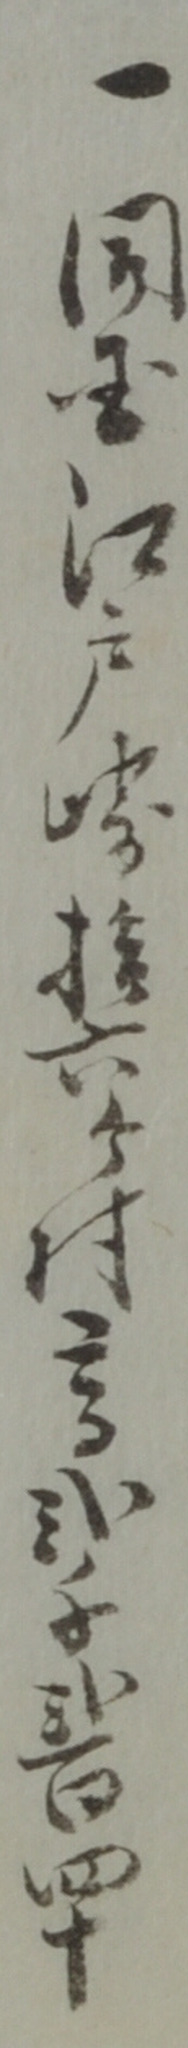一同国江戸崎拾六ケ村高弐千弐百四十
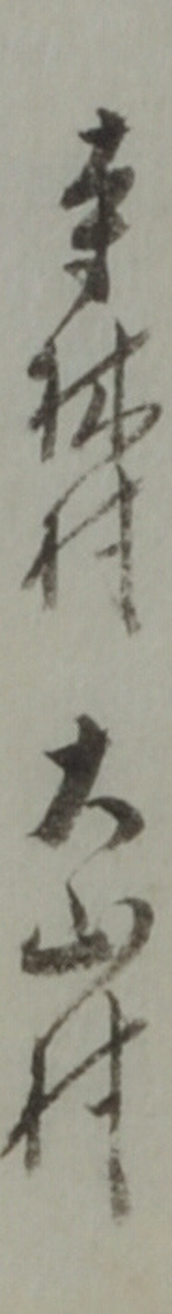寺林村大山村
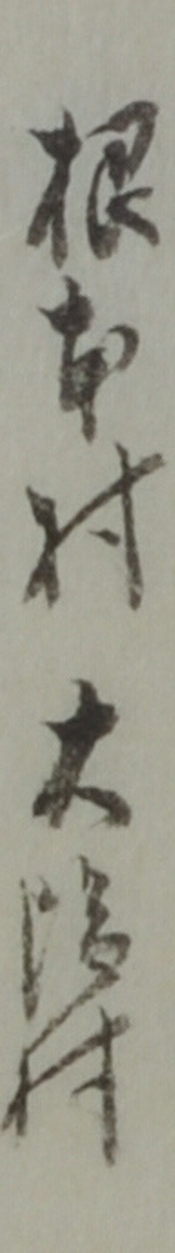根本村大塩村
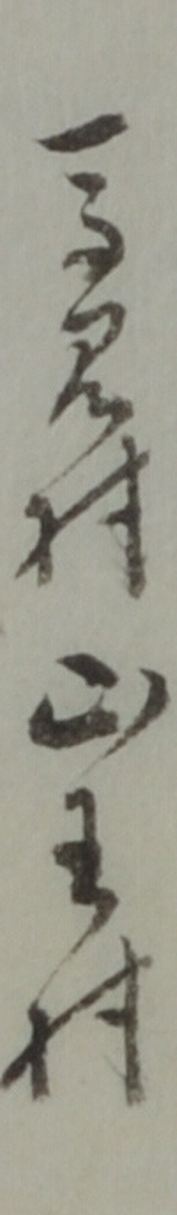高見村山王村
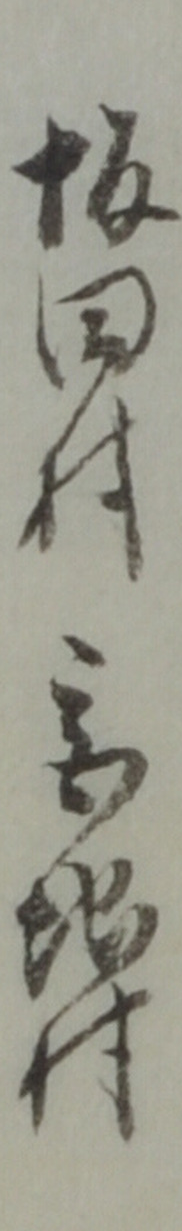坂田村高地村
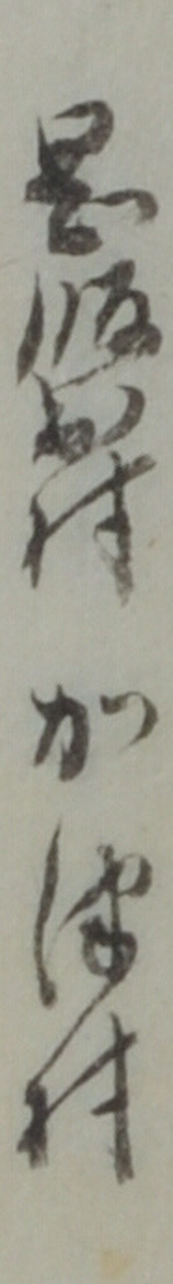岡飯出村加沢村
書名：内藤重頼公御代分限帳（写）
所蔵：伊那市立高遠町図書館・合同会社AMANE
